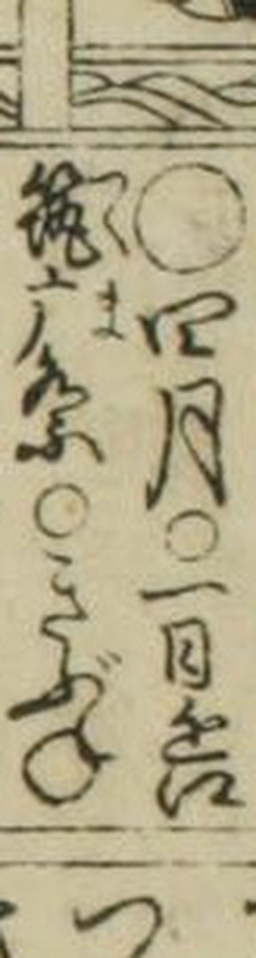筑摩祭○きぶね
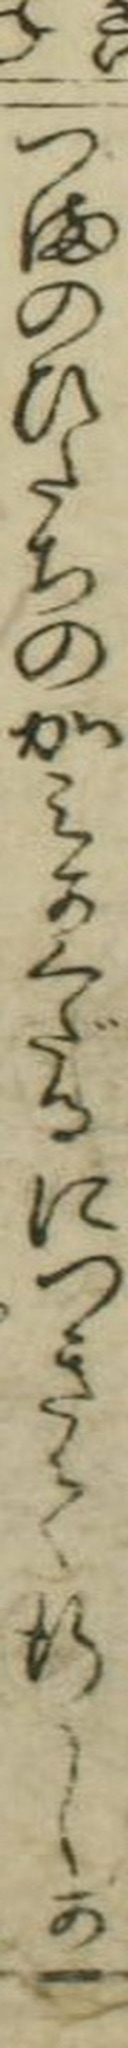つまのひたちのかみかくだるにつきて行しか。
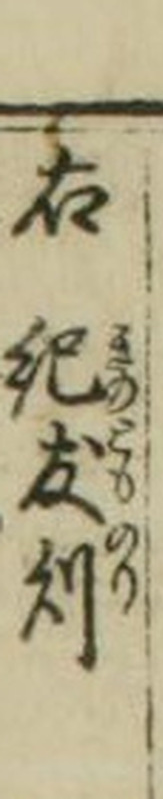右紀友則
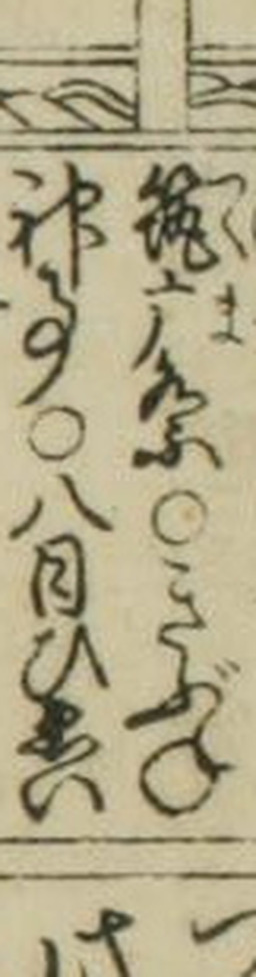神事○八日ひゑい
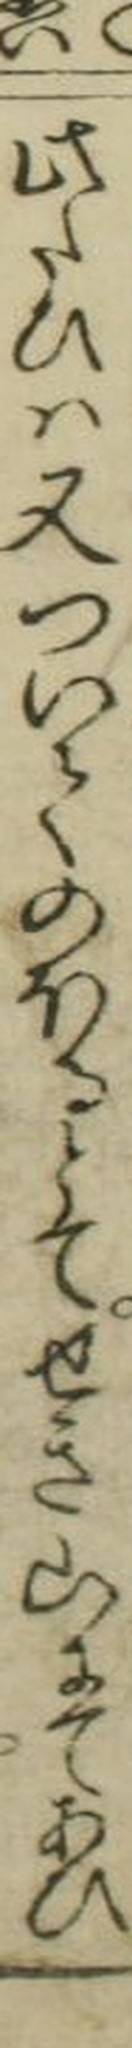此たひは又ついてのほるとて。せき山にてあひ
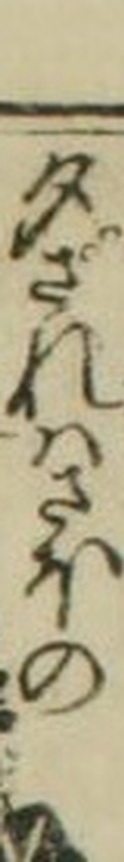夕ざれはさほの
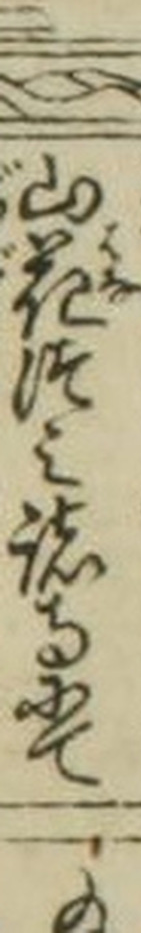山花つみ諸寺にて
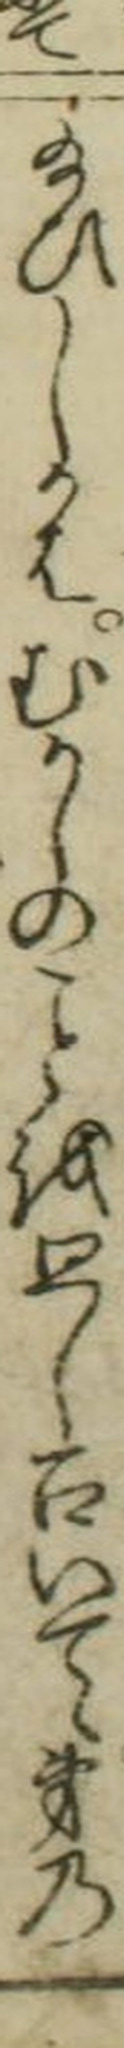給ひしかは。むかしのことを思し召いてゝ。弟の
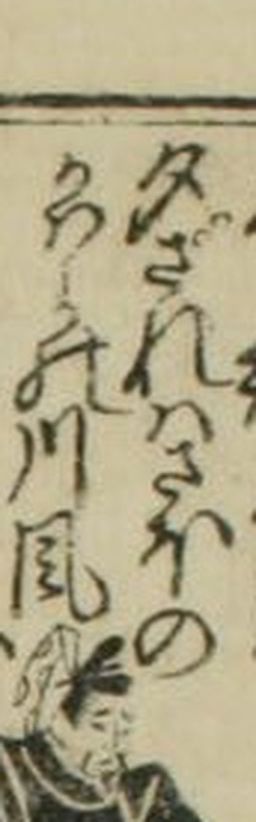かはらの川風に
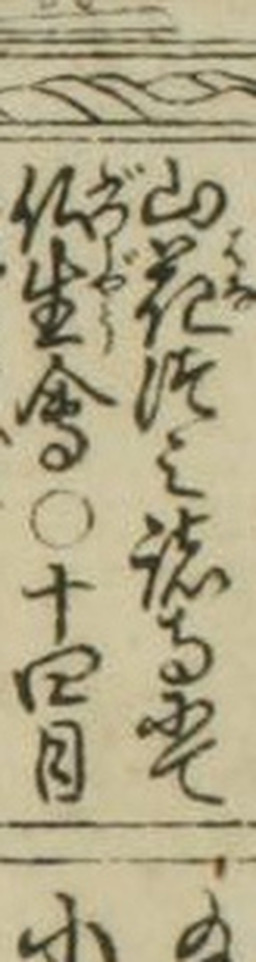仏生会○十四日
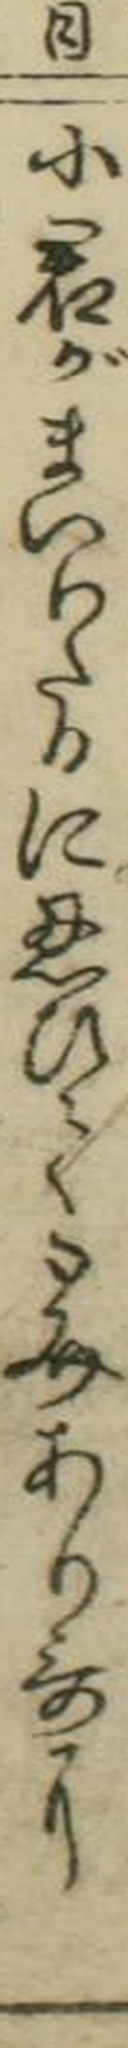小君がまいりたるに。忍ひて御文あり哥に
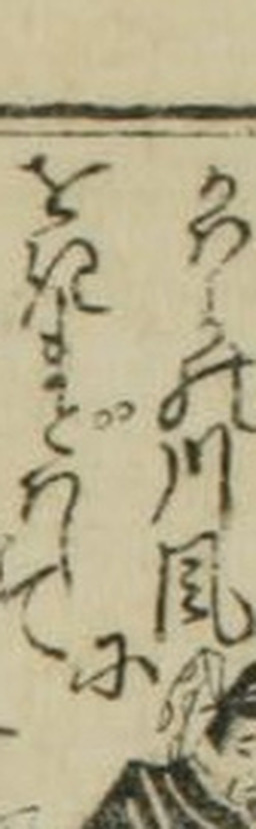をきまどはして
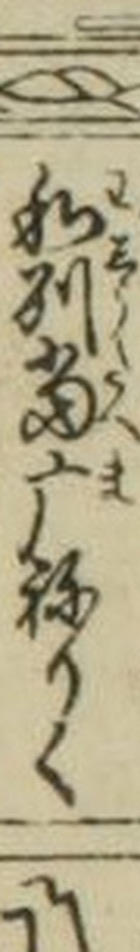和州当麻ねりく
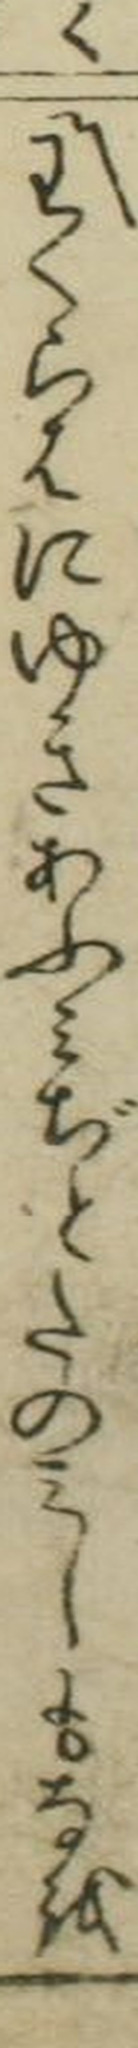〽わくらはにゆきあふみぢとたのみしもなを
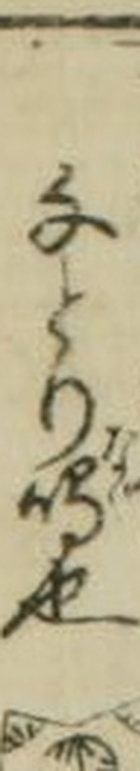ちとり鳴也
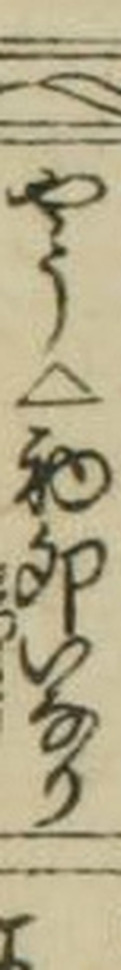やう△初卯いなり
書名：女源氏教訓鑑
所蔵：東京学芸大学附属図書館
